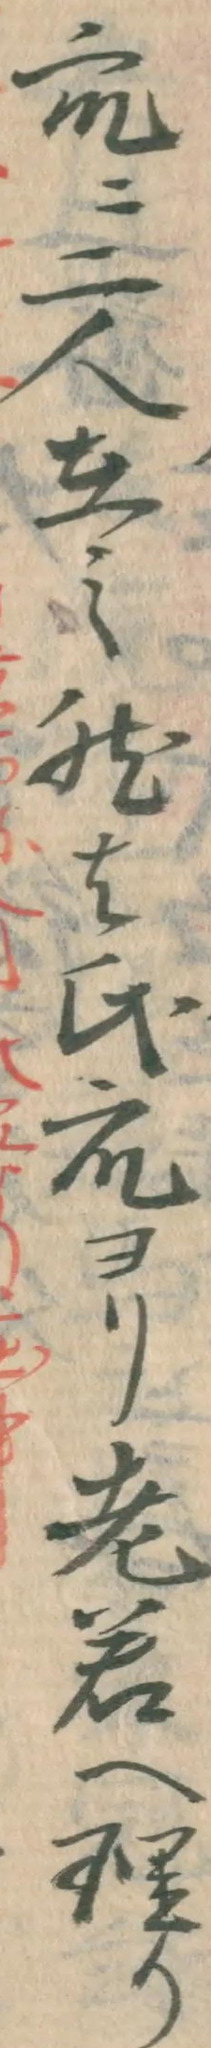衆ニ二人在之然は氏衆ヨリ老若へ理り
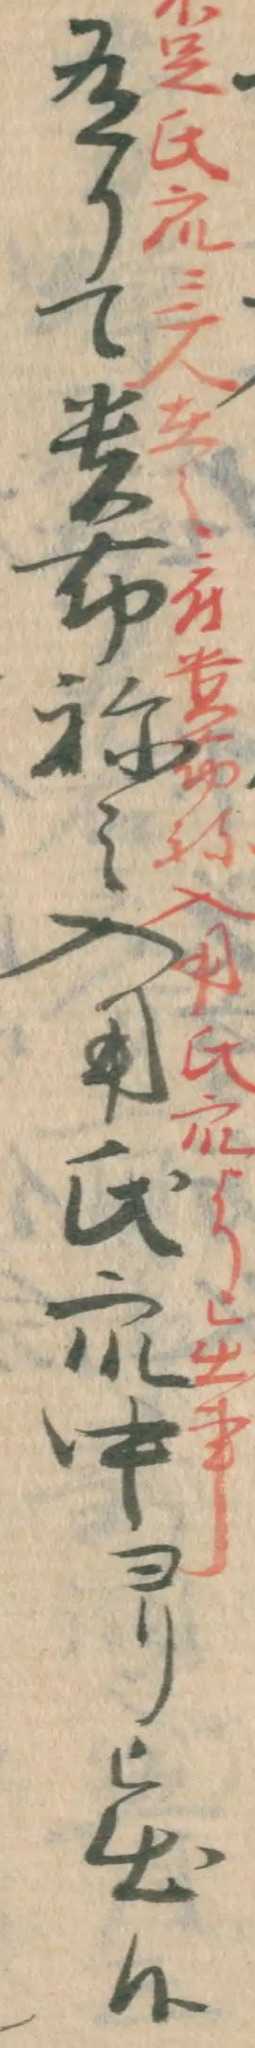有りて貴ふね之入用氏衆中ヨリ被出候
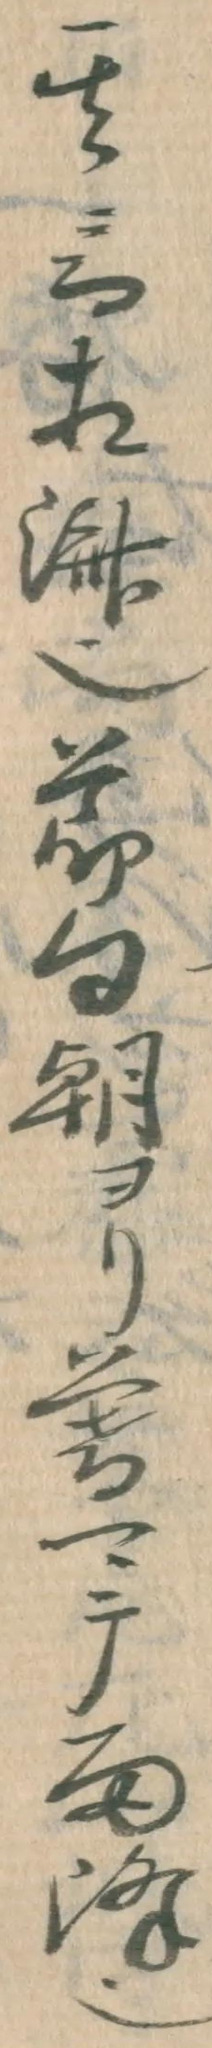其ニ而相済也節句朝ヨリ暮マテ雨降也
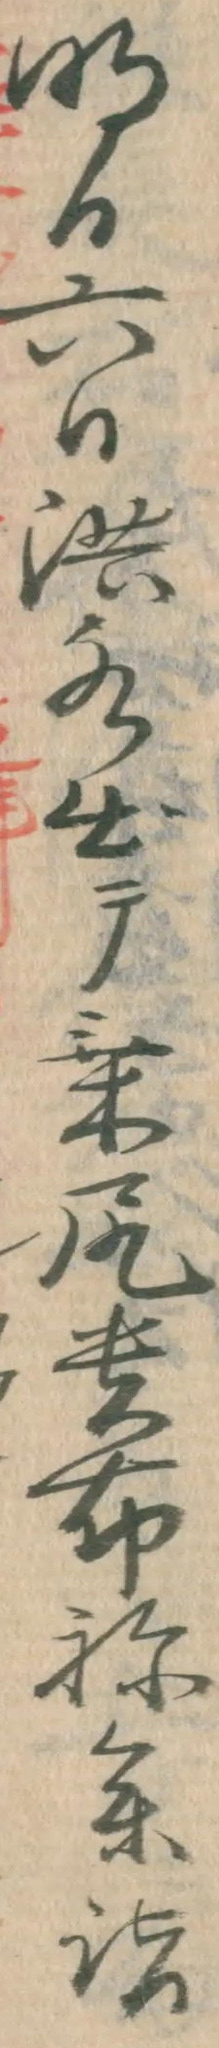明日六日洪水出テ乗尻貴ふね参詣
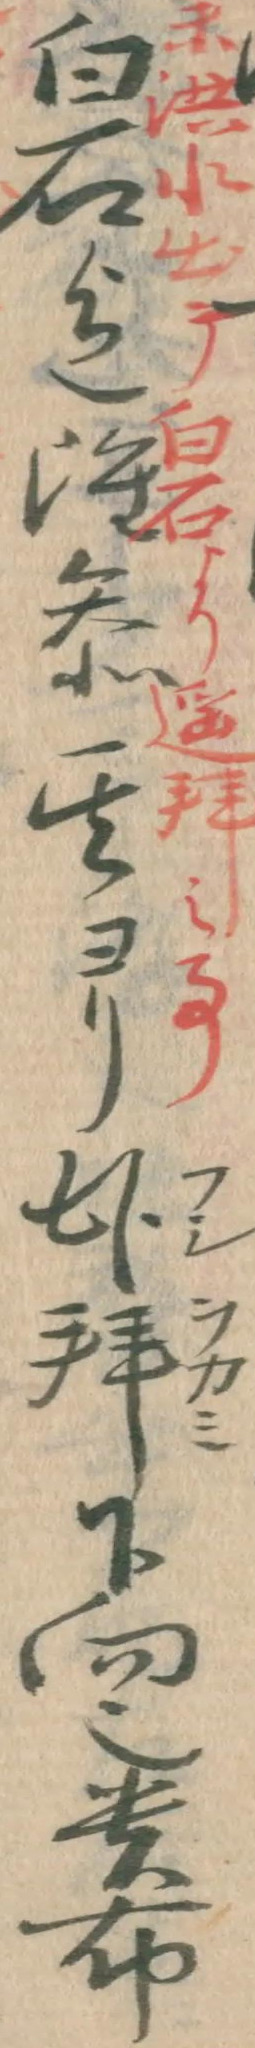白石迄雖参其ヨリ臥拝下向也貴ふ
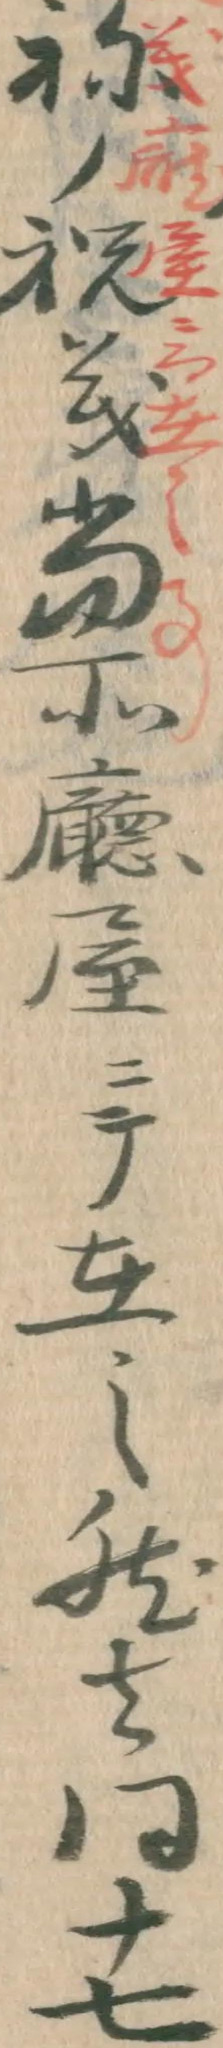ねノ祝義当所庁屋ニテ在之然は同十七
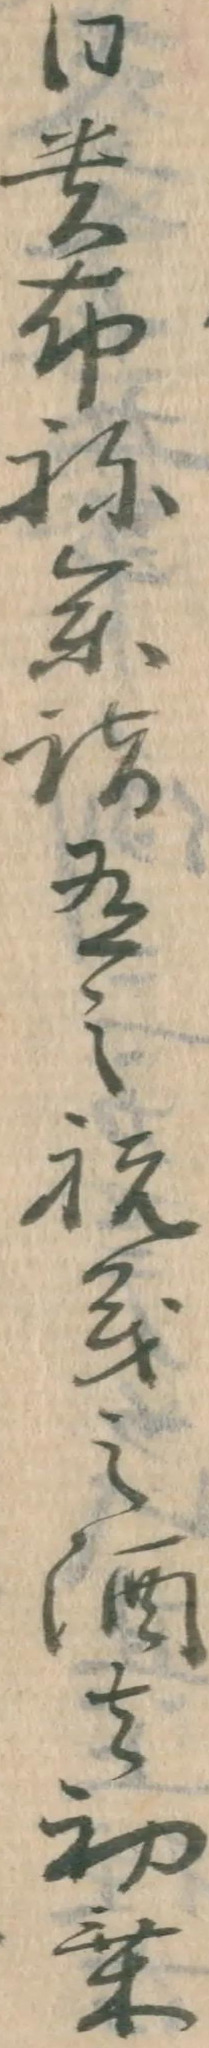日貴ふね参詣有之祝義之酒は初乗
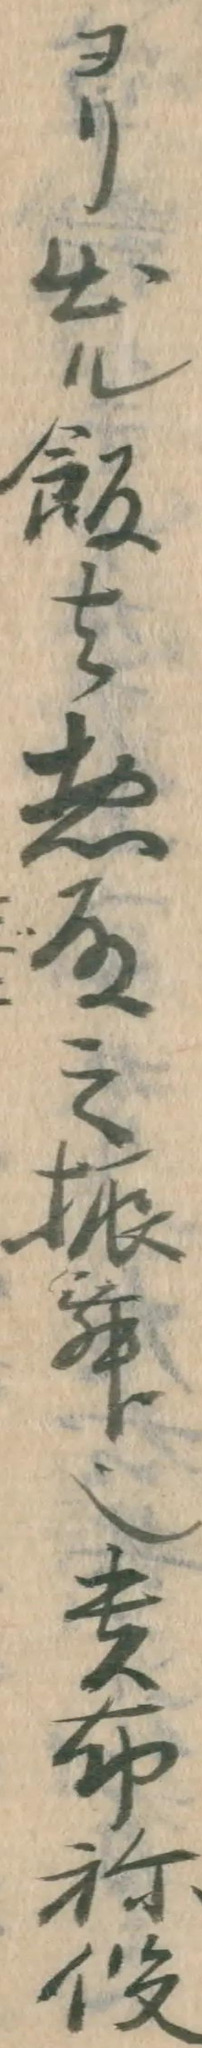ヨリ出ル飯は惣殿之振舞也貴ふね役
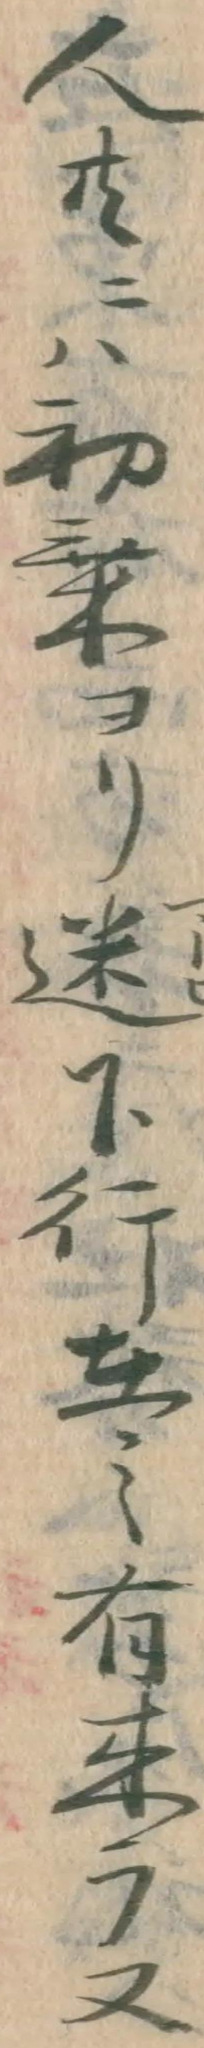人共ニハ初乗ヨリ迷下行在之有来ヲ又
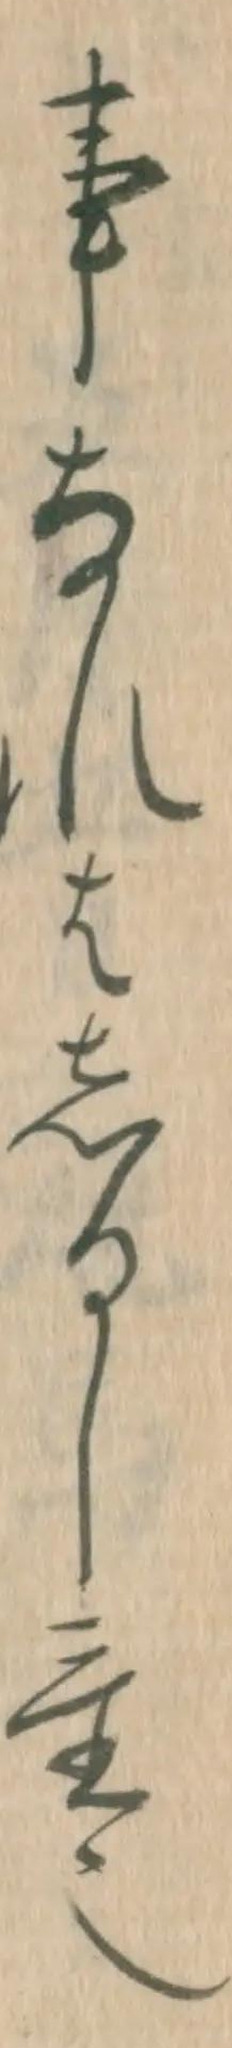事なれはしるし置也
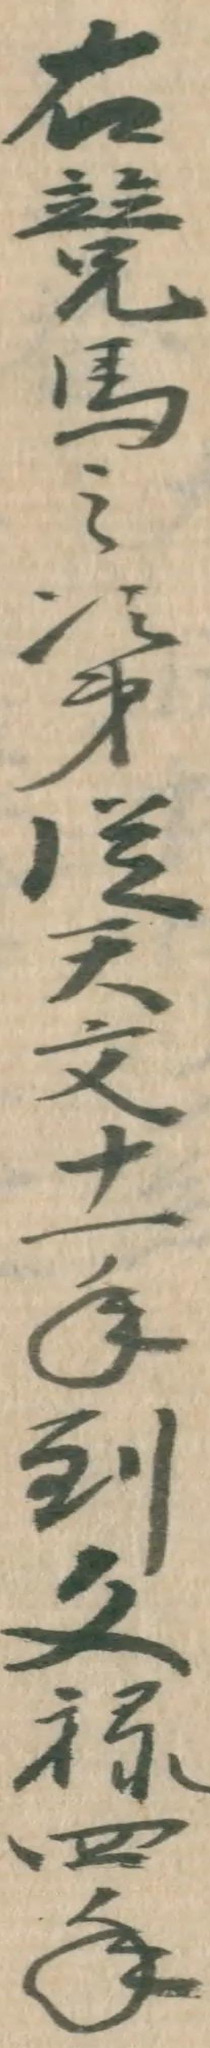右競馬之次第従天文十一年到文禄四年
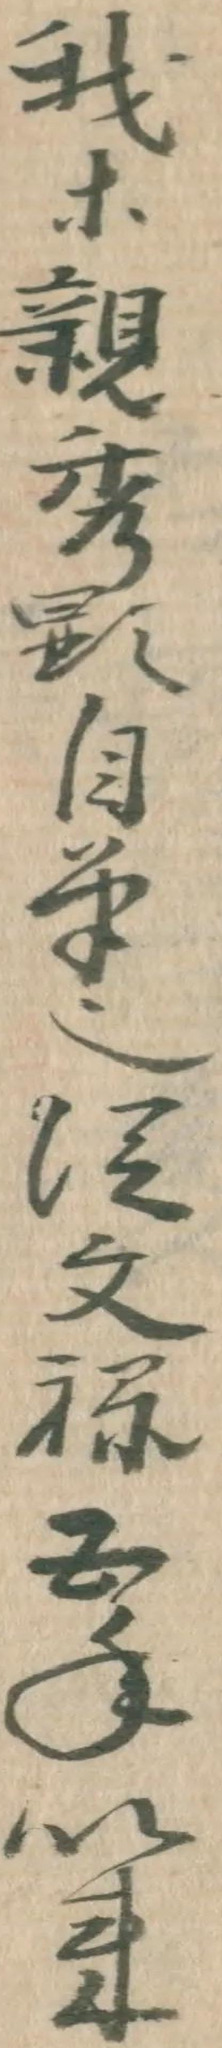我等親秀顕自筆也従文禄五年以来
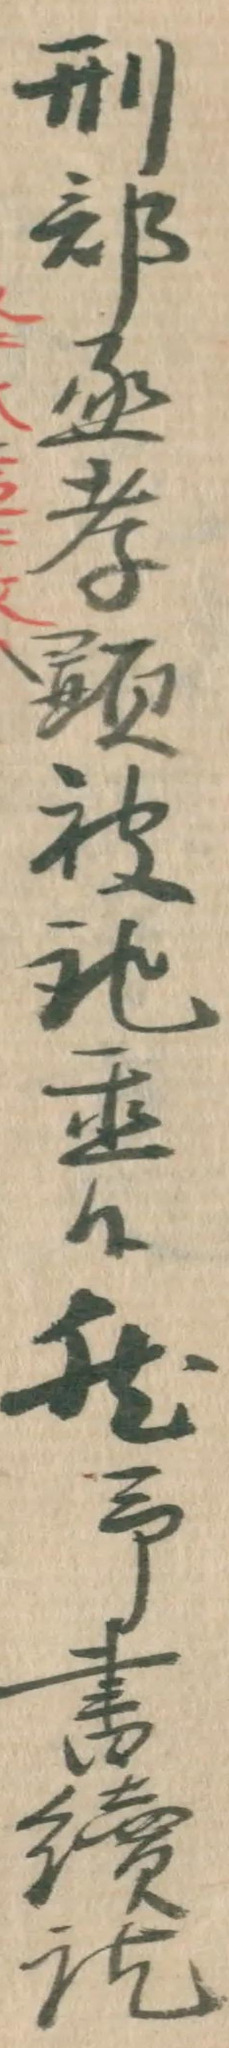刑部丞孝顕被記置候然予書続訖
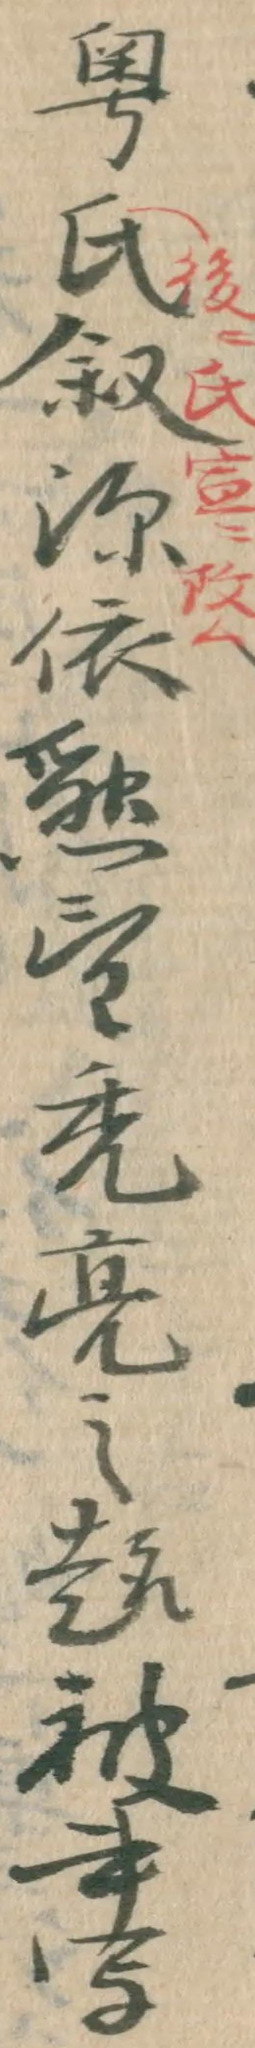奥氏叙深依懇望禿亮之趣被書写
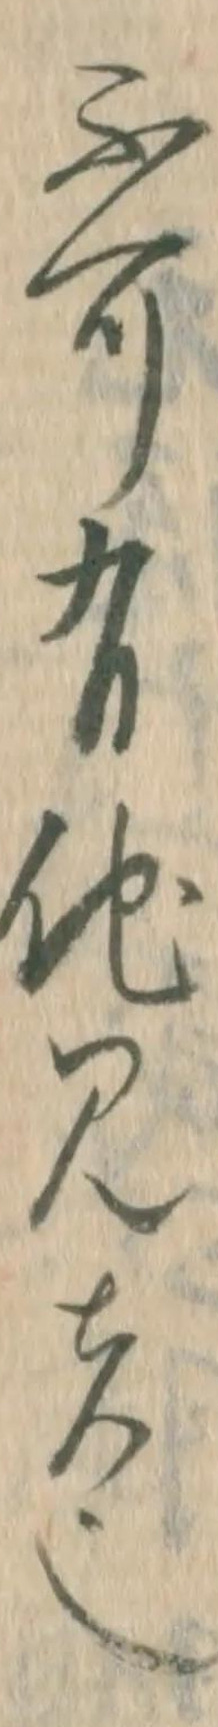不可有他見者也

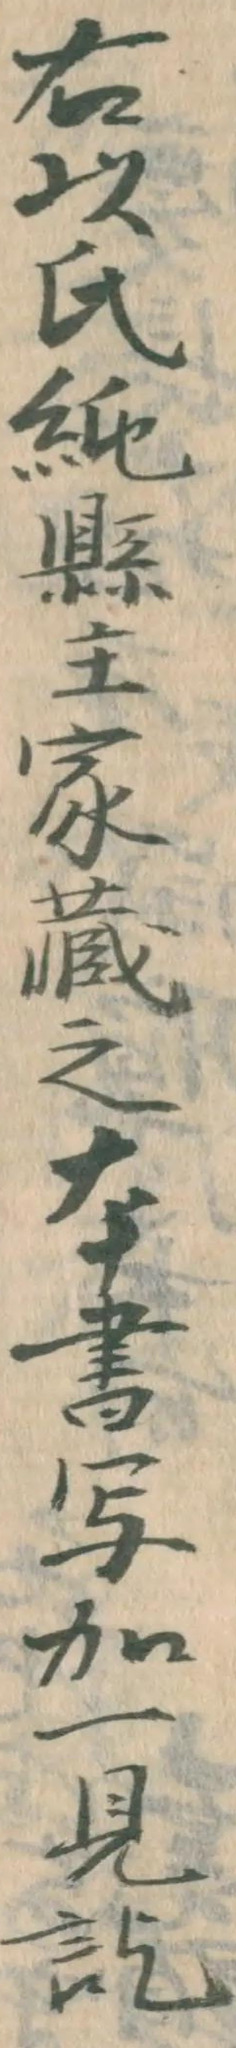右以氏純県主家蔵之本書写加一見訖
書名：賀茂社記録. 第10冊
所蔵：国立国会図書館 National Diet Library, JAPAN
